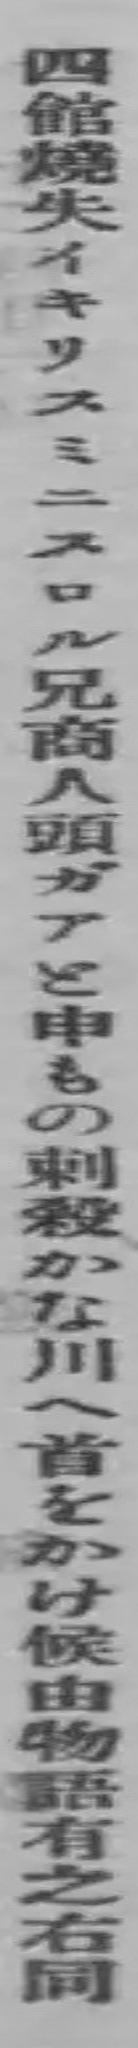四館焼失イキリスミニスロル兄商人頭ガアと申もの刺殺かな川へ首をかけ候由物語有之右同
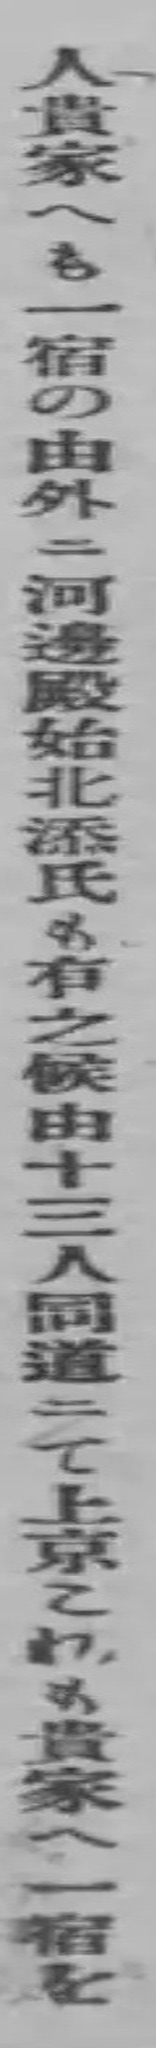人貴家へも一宿の由外ニ河邉殿始北添氏も有之候由十三人同道ニて上京これも貴家へ一宿を
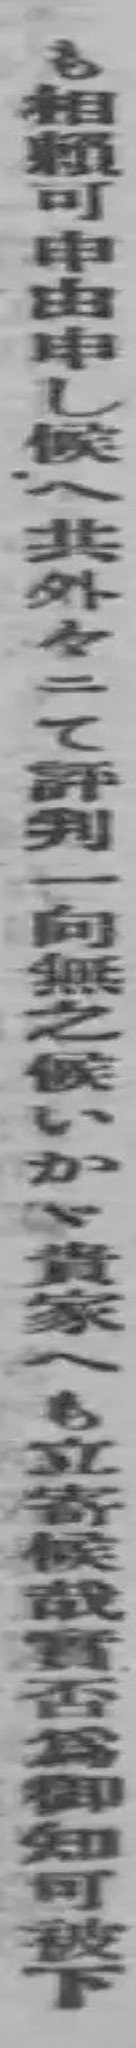も相頼可申由申し候へ共外々ニて評判一向無之候いかゞ貴家へも立寄候哉実否為御知可被下
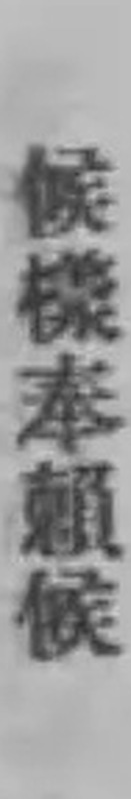候様奉頼候
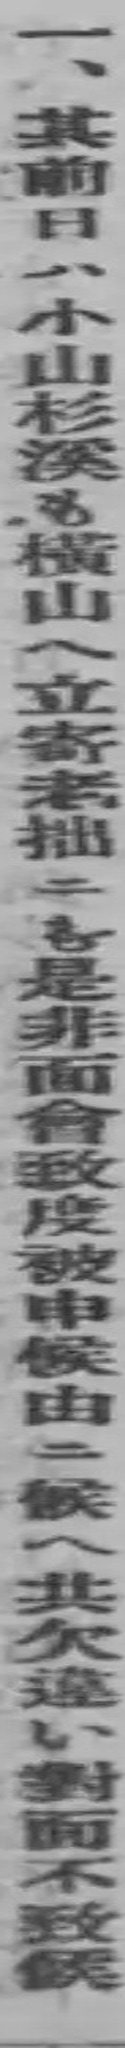一、其前日は小山杉渓も横山へ立寄老拙ニも是非面会致度被申候由ニ候へ共欠違い対面不致候
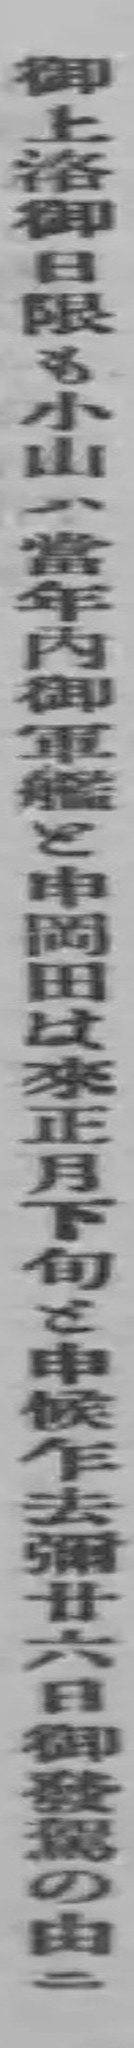御上洛御日限も小山は当年内御軍艦と申岡田は来正月下旬と申候乍去弥廿六日御発駕の由ニ
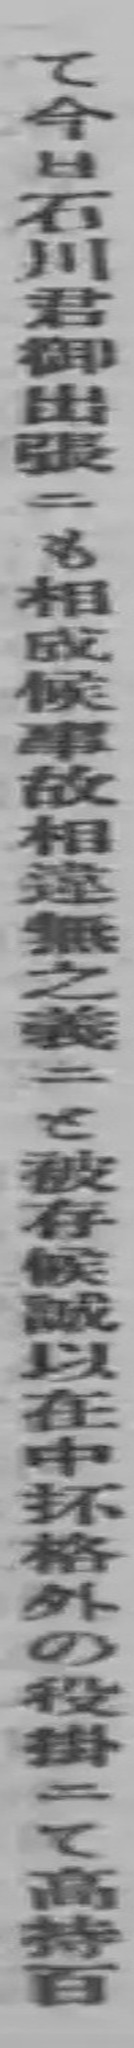て今日石川君御出張ニも相成候事故相違無之義ニと被存候誠以在中抔格外の役掛ニて高持百
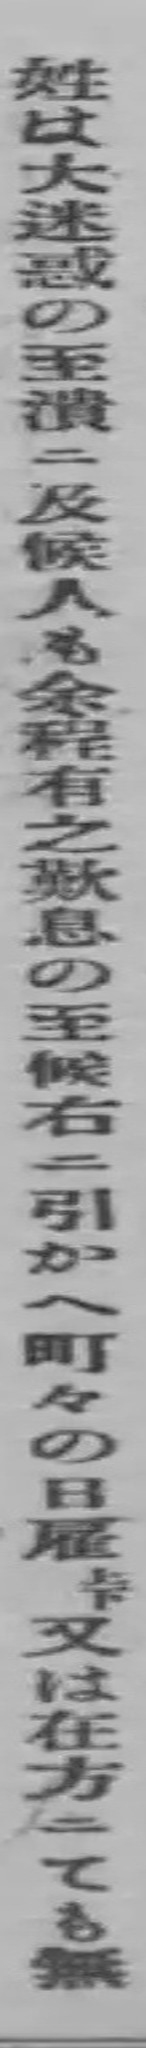姓は大迷惑の至潰ニ及候人も余程有之歎息の至候右ニ引かへ町々の日雇上下又は在方ニても無
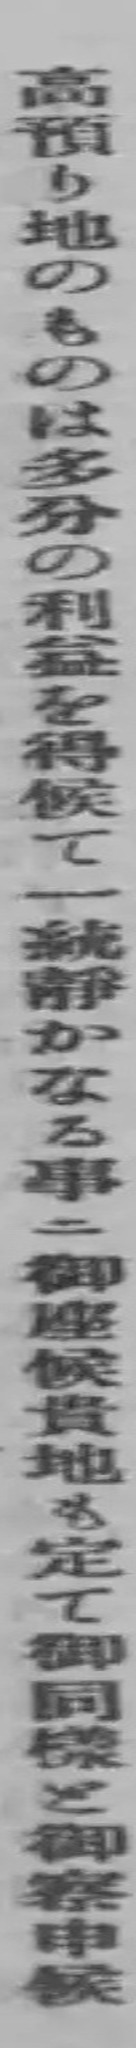高預り地のものは多分の利益を得候て一統静かなる事ニ御座候貴地も定て御同様と御察申候
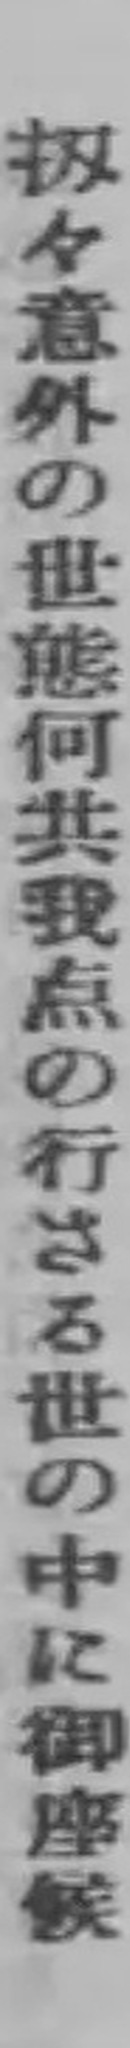扨々意外の世態何共我点の行さる世の中に御座候
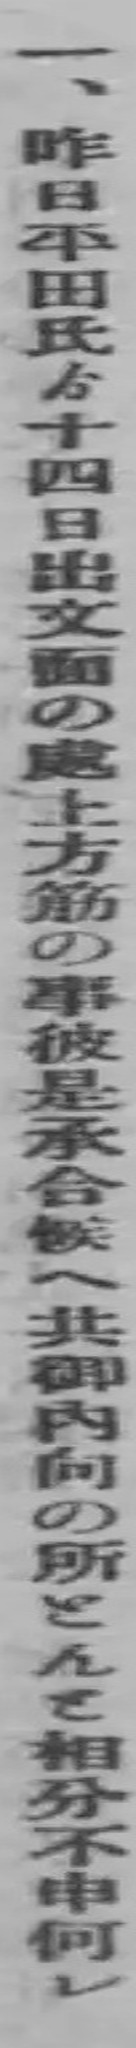一、昨日平田氏ゟ十四日出文面の処上方筋の事彼是承合候へ共御内向の所とんと相分不申何レ
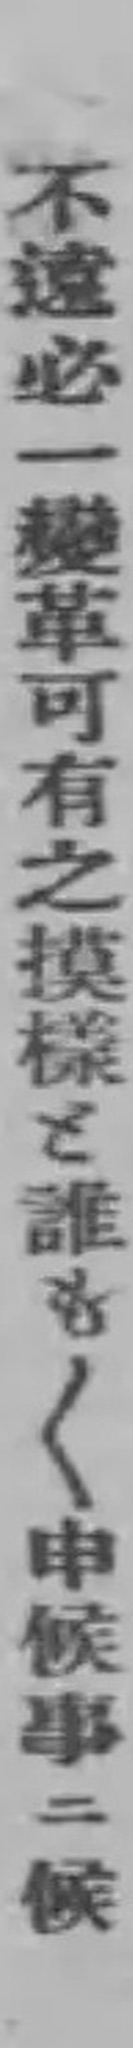不遠必一変革可有之模様と誰も〳〵申候事ニ候
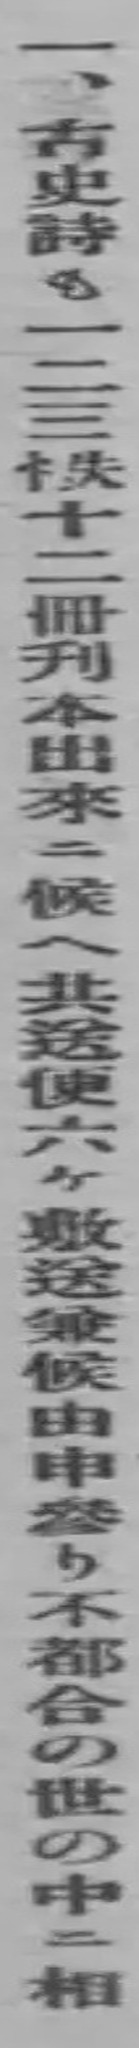一、古史詩も一二三帙十二冊刊本出来ニ候へ共送便六ケ敷送兼候由申参り不都合の世の中ニ相

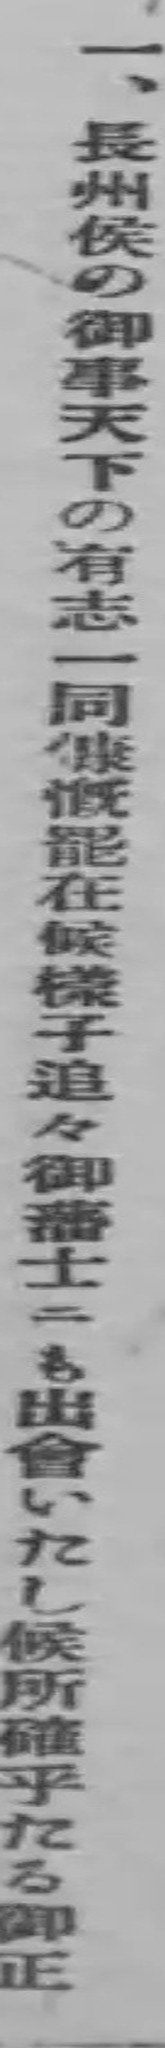一、長州侯の御事天下の有志一同穅慨罷在候様子追々御藩士ニも出会いたし候所確乎たる御正
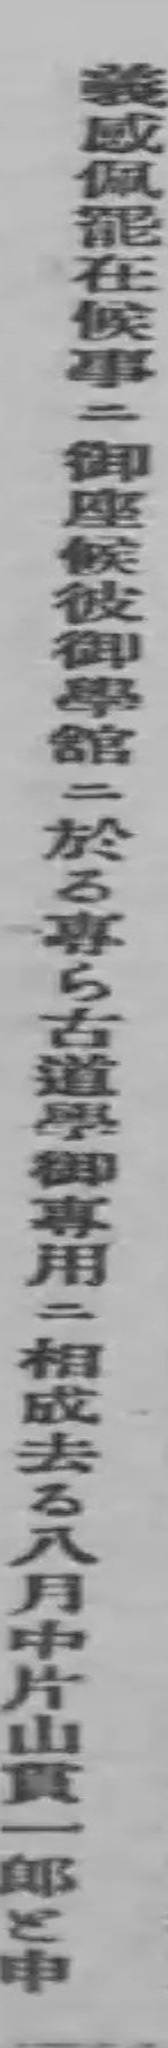義感佩罷在候事ニ御座候彼御学館ニ於る専ら古道学御専用ニ相成去る八月中片山貫一郎と申
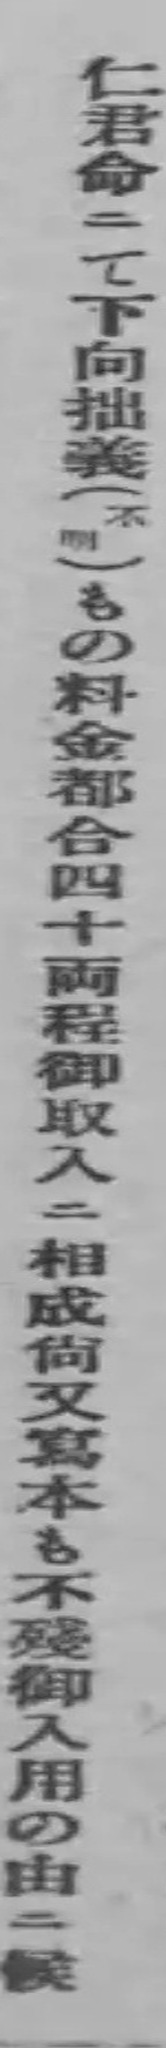仁君命ニて下向拙義(不明)もの料金都合四十両程御取入ニ相成尚又写本も不残御入用の由ニ候
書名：豊橋市史談
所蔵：国立国会図書館 National Diet Library, JAPAN
